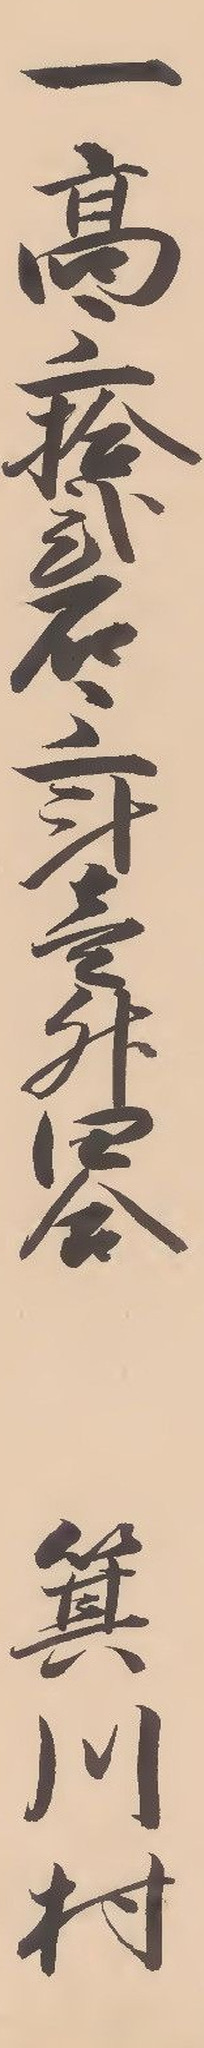一高三拾弐石三斗壱升四合箕川村

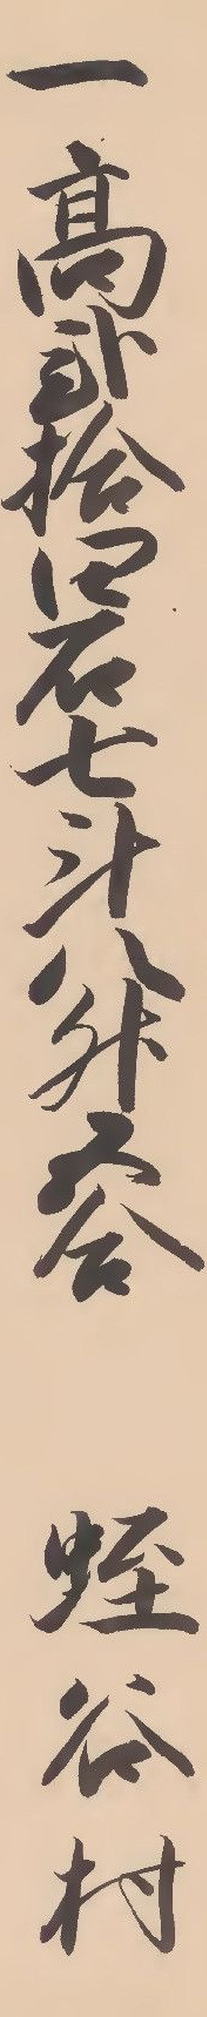一高弐拾四石七斗八升五合蛭谷村
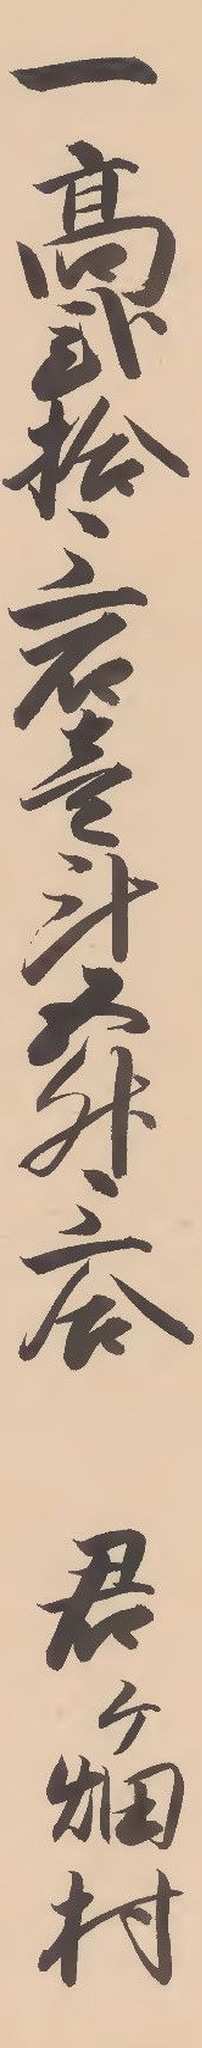一高弐拾三石壱斗五升三合君ケ畑村
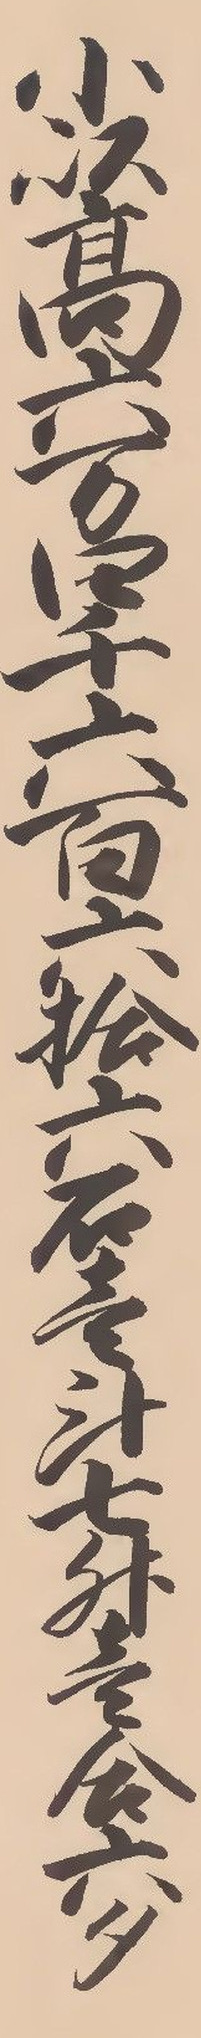小以高六万四千六百六拾六石壱斗七升壱合六勺
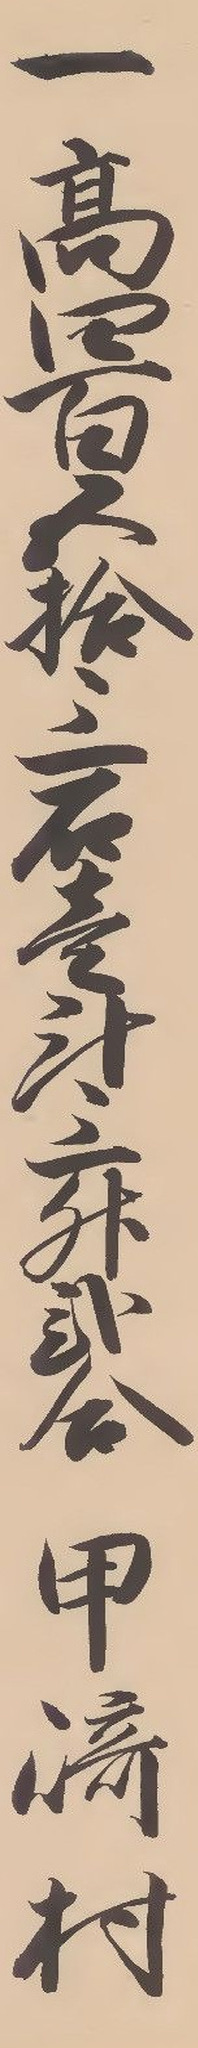一高四百五拾三石壱斗三升弐合甲崎村
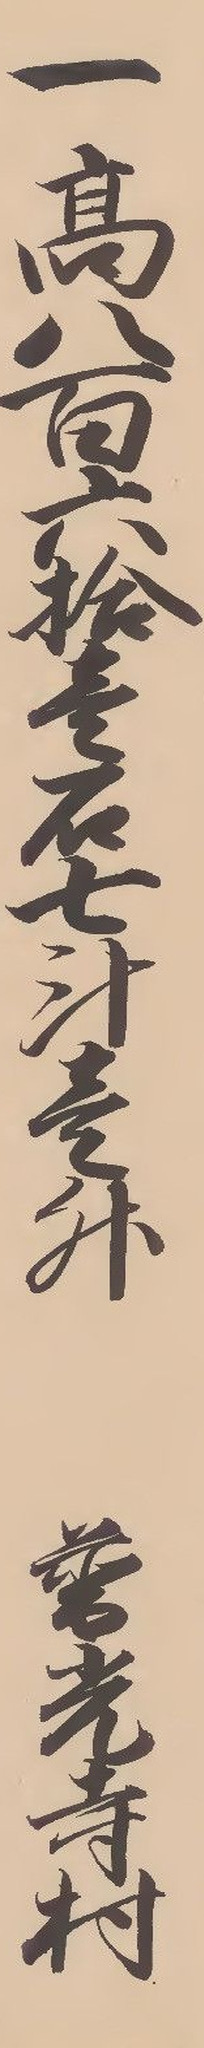一高八百六拾壱石七斗壱升普光寺村
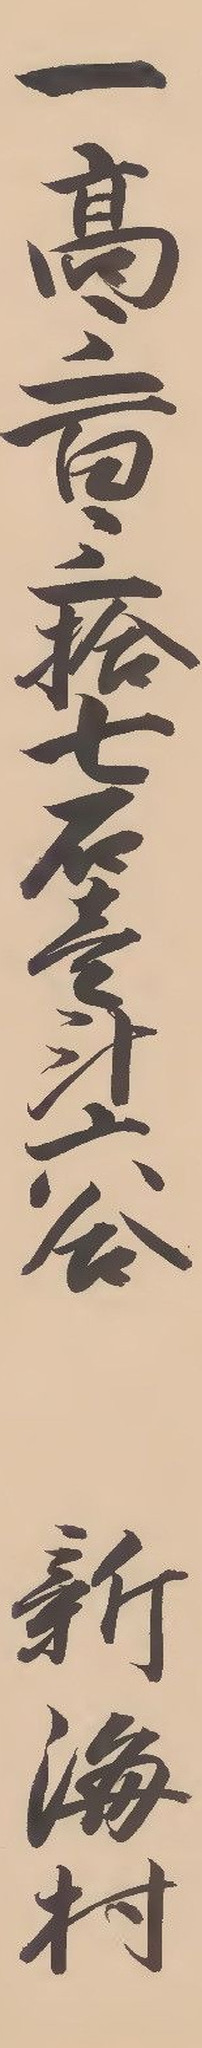一高三百三拾七石壱斗六合新海村

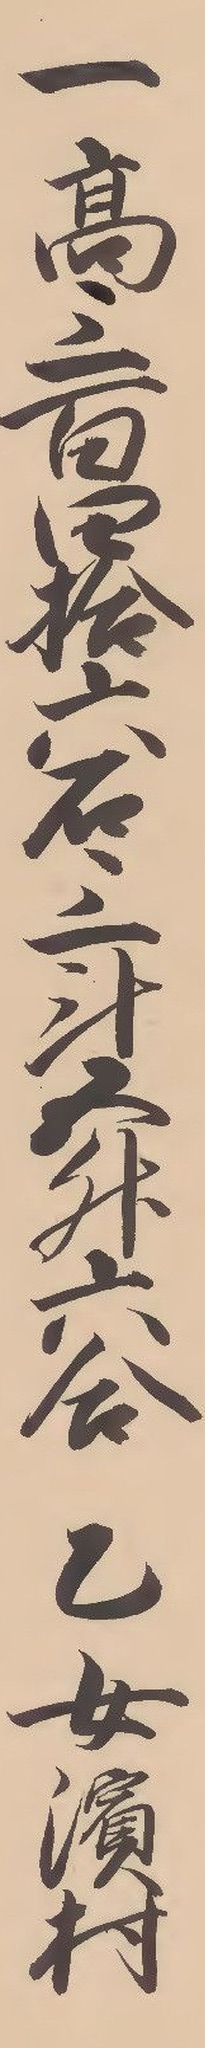一高三百四拾六石三斗五升六合乙女浜村
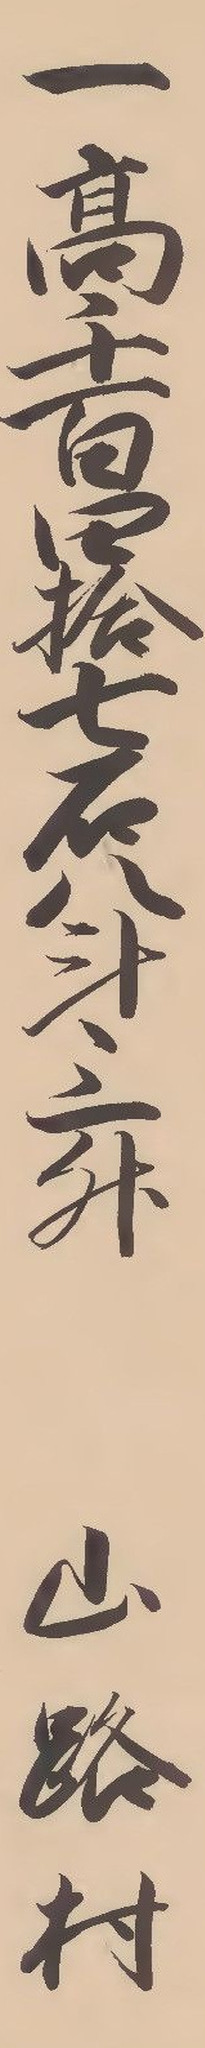一高千百四拾七石八斗三升山路村
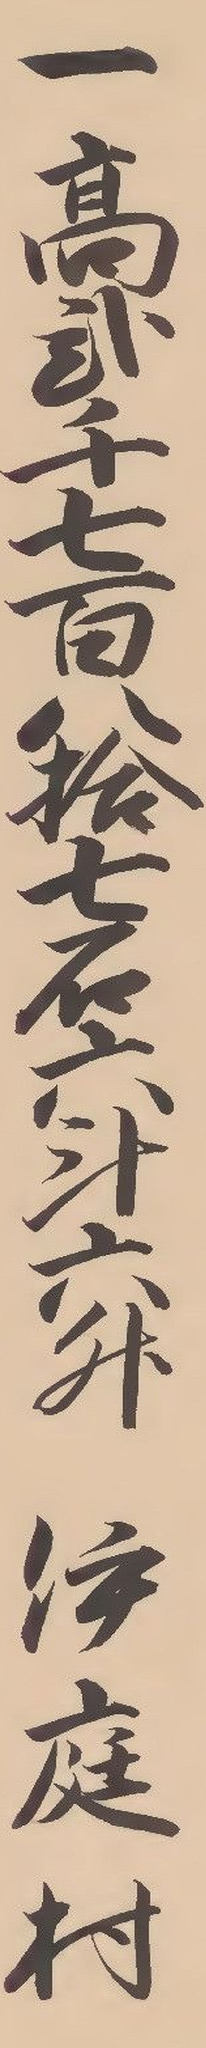一高弐千七百八拾七石六斗六升伊庭村
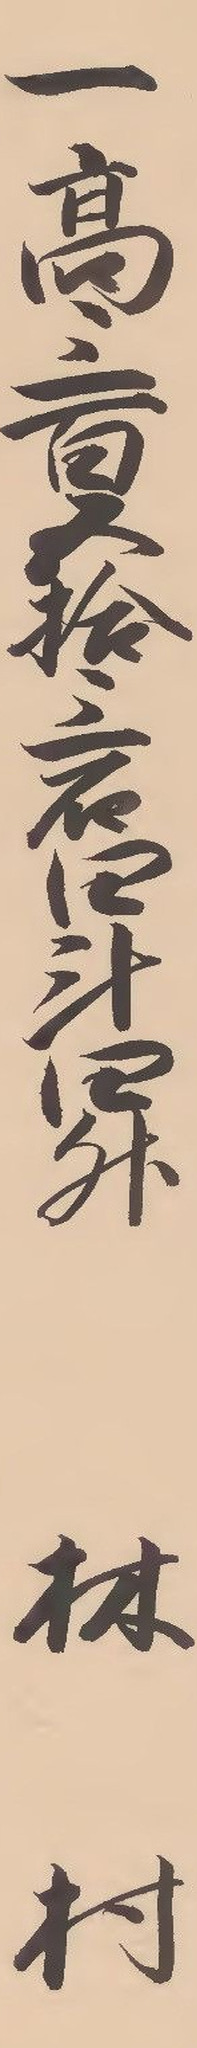一高三百五拾三石四斗四升林村
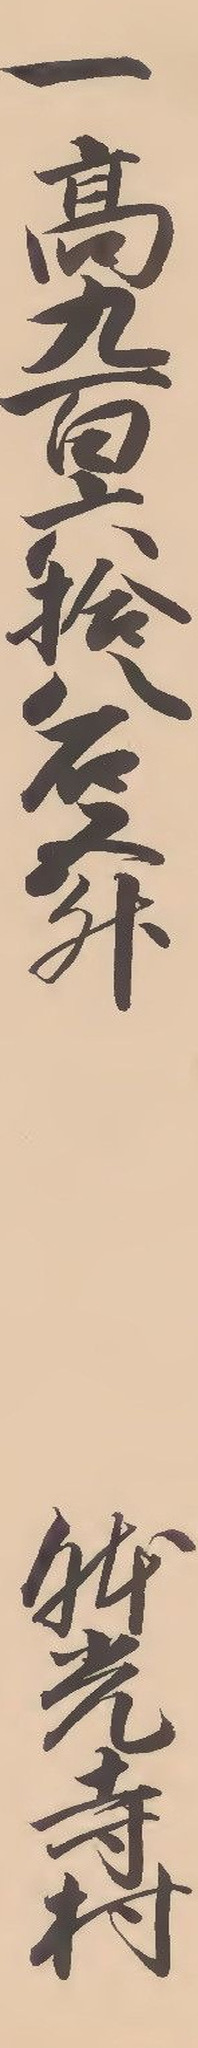一高九百六拾八石五升躰光寺村
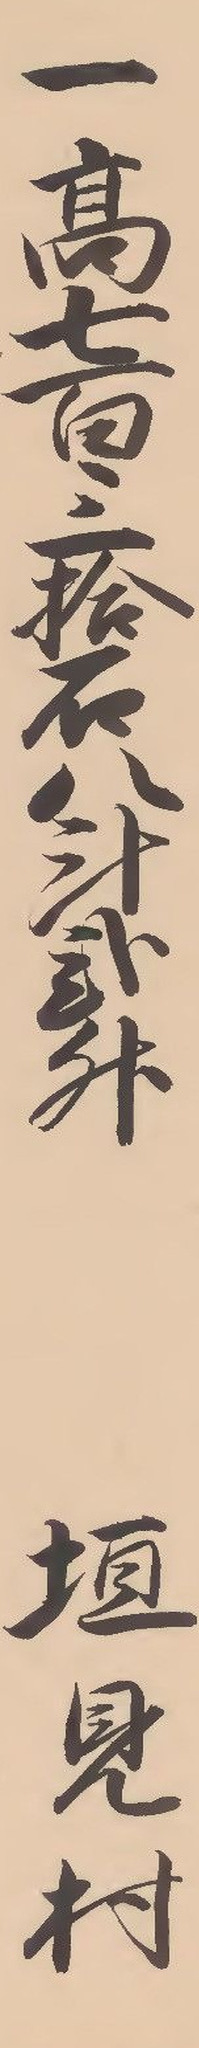一高七百三拾石八斗弐升垣見村
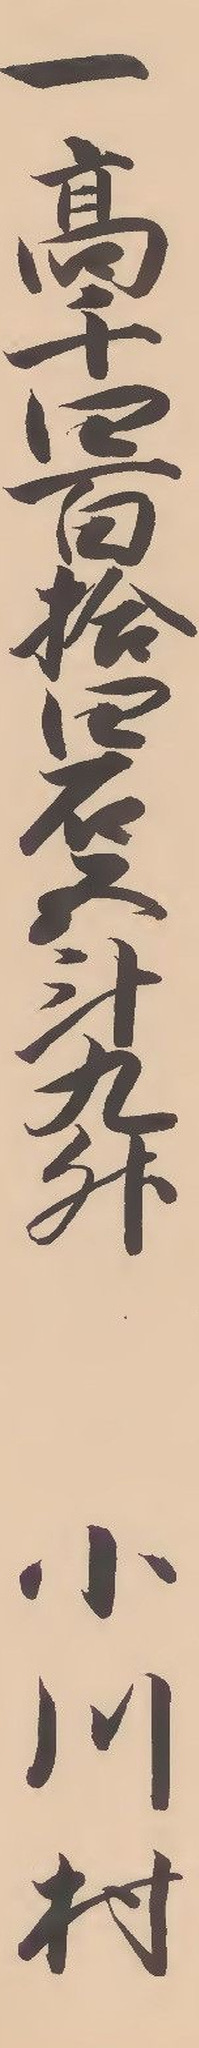一高千四百拾四石五斗九升小川村

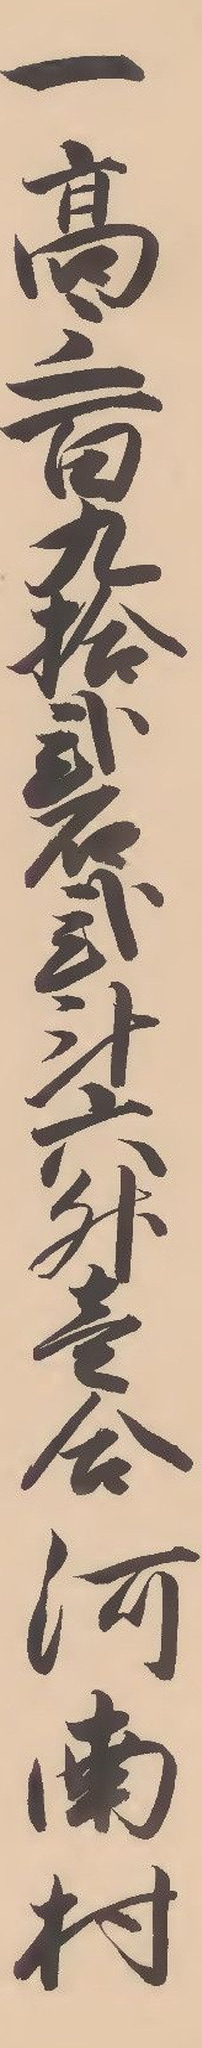一高三百九拾弐石弐斗六升壱合河南村
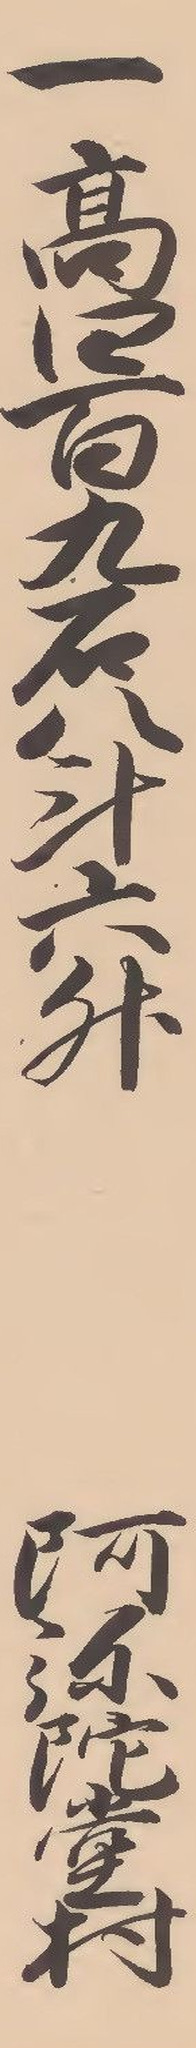一高四百九石八斗六升阿弥陀堂村
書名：近江国郷帳
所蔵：国立公文書館 National Archives of Japan
